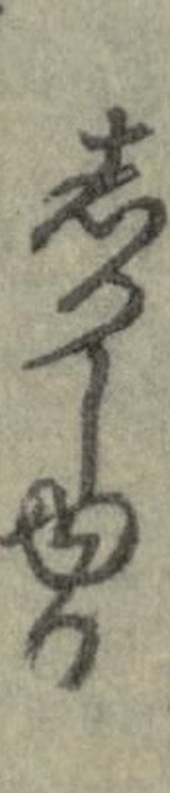しかしゆり
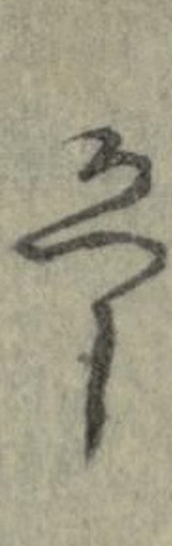かへし
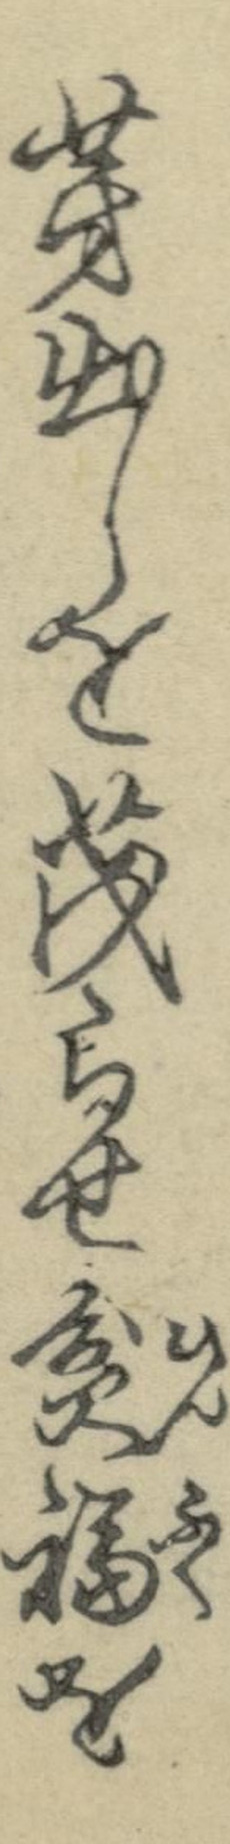芽出しを茂らせ貧福を
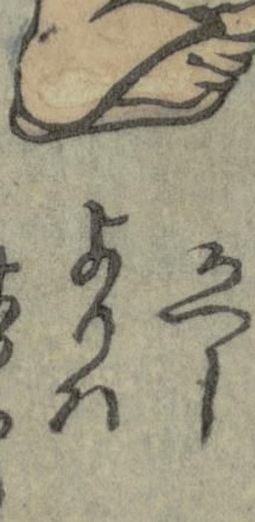よりハ
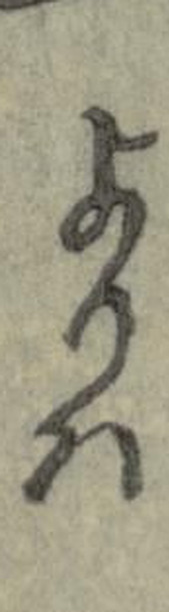よりハ
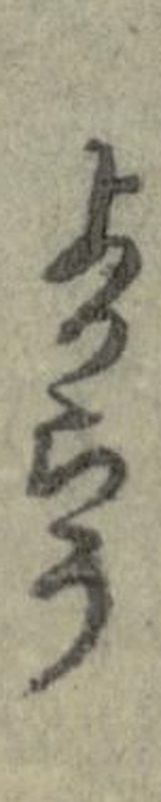よからう
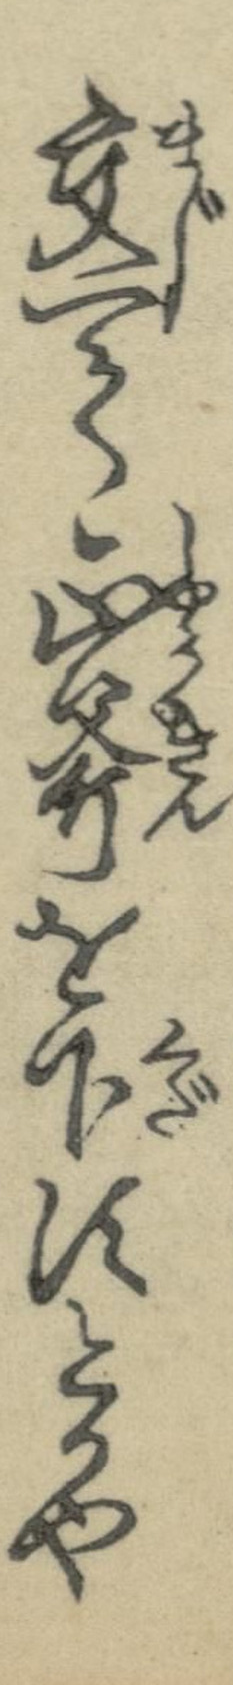交へて正斧を下すとかや
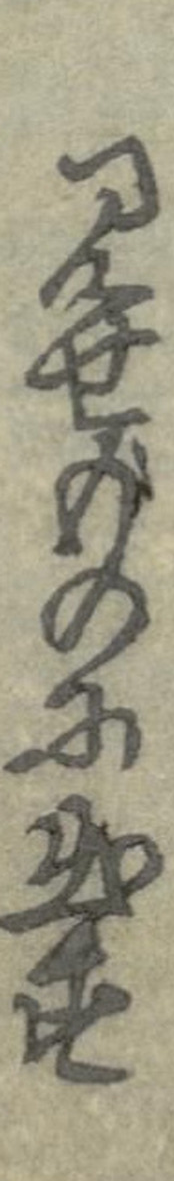見せものに出す
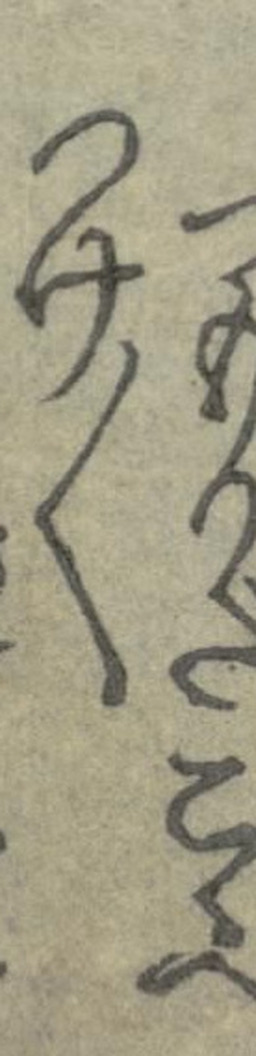つけ〳〵
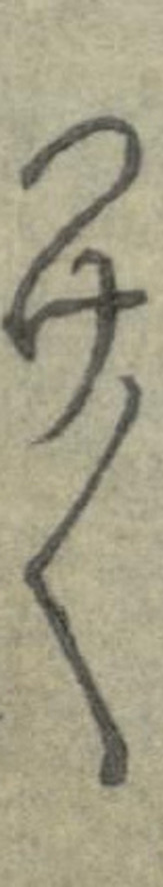つけ〳〵
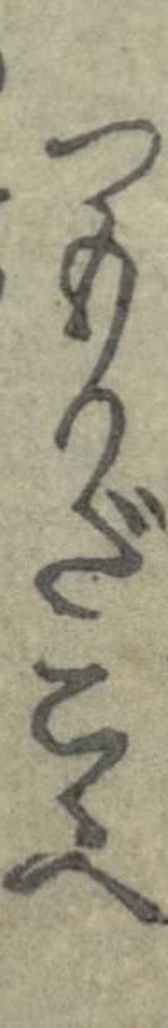つもりだこゝへ
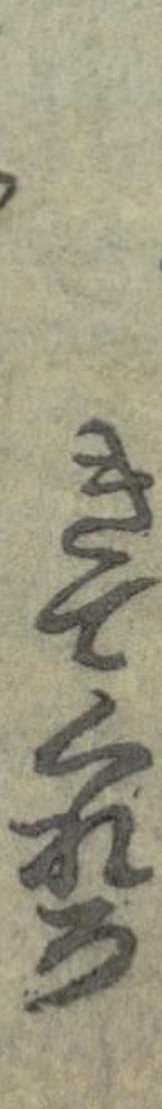きてくれろ
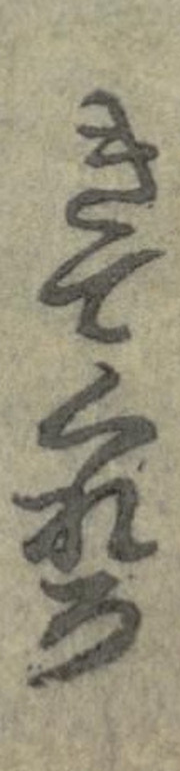きてくれろ
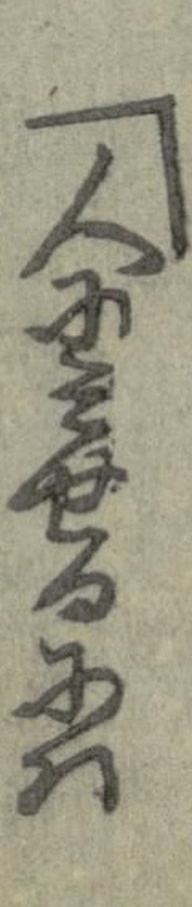〽人にみせるにハ
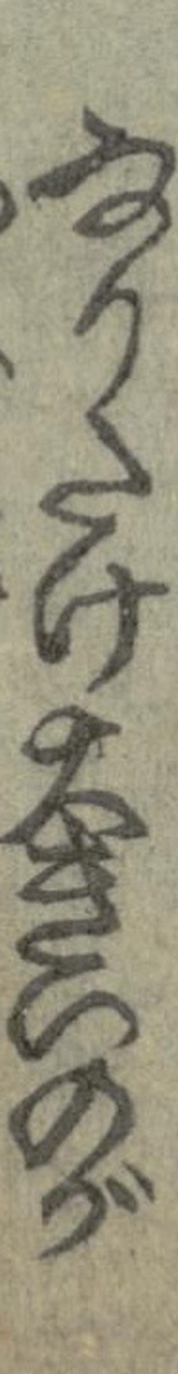なりたけ大きいのが
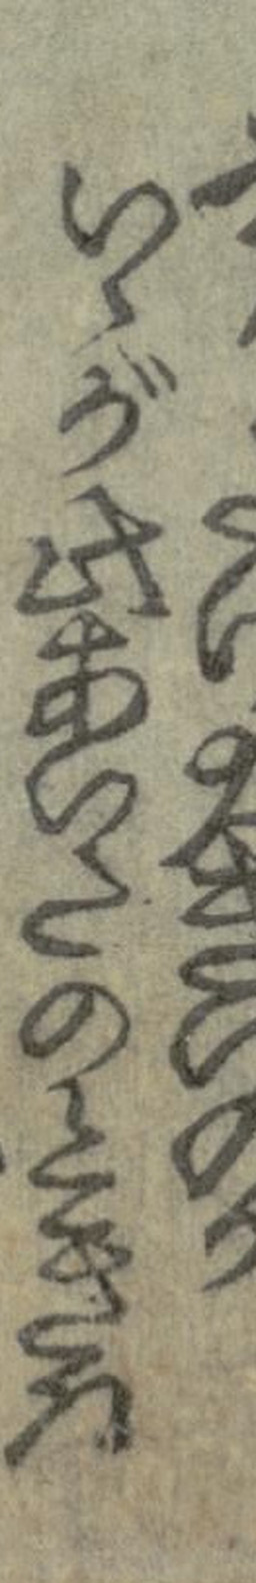いゝが此あいたのときハ
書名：大鯰江戸の賑ひ
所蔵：東京大学地震研究所図書室 Earthquake Research Institute Library, The University of Tokyo, JAPAN
